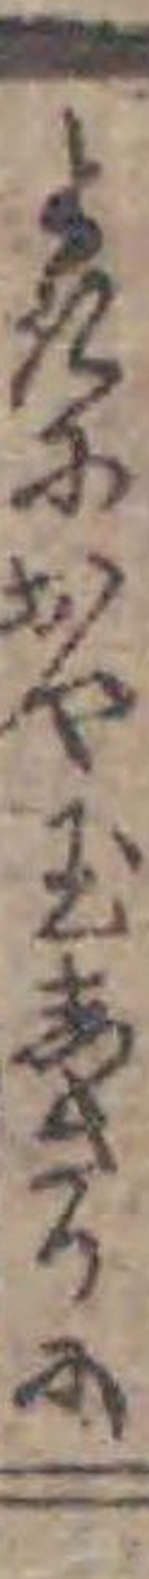ときにおや玉しきりに
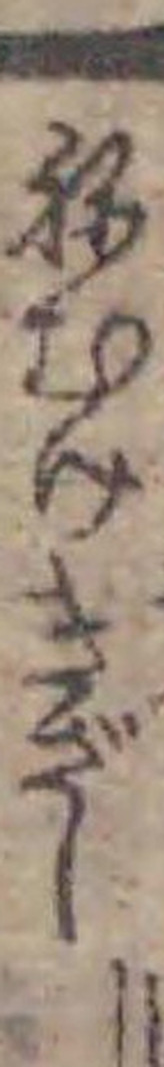ねむけきざし
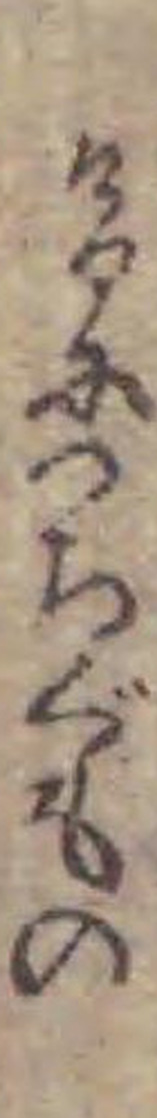けるにつちぐもの
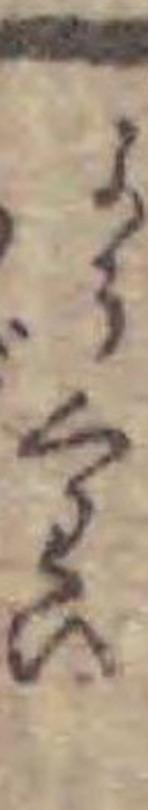ようくわい
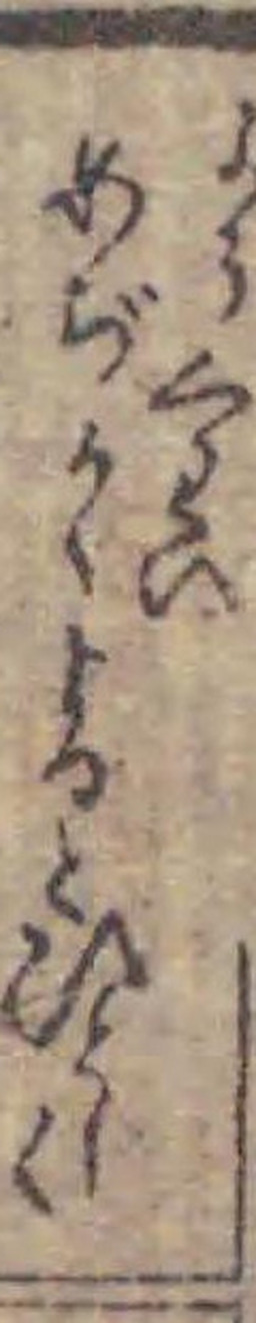めぢかくす？るとひとしく
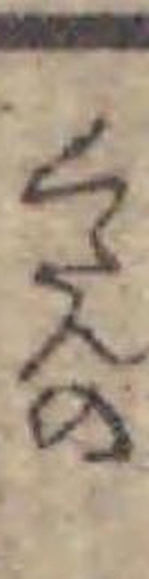くたんの
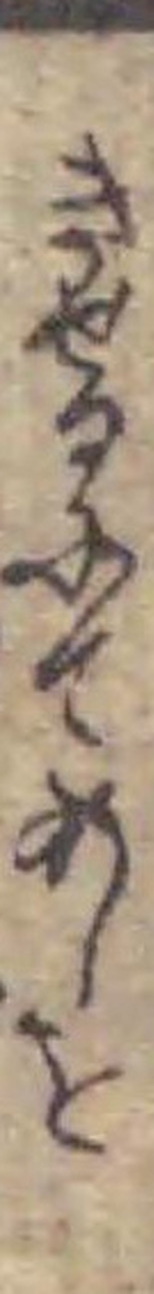きせるにてあしを
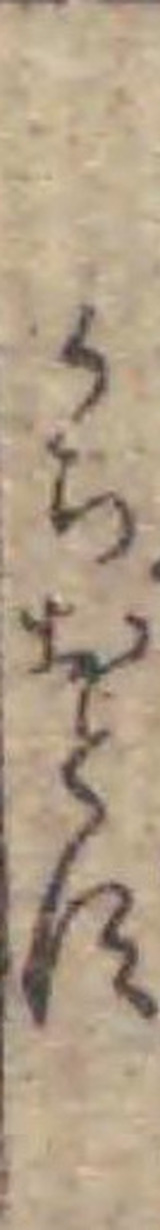うちおとす
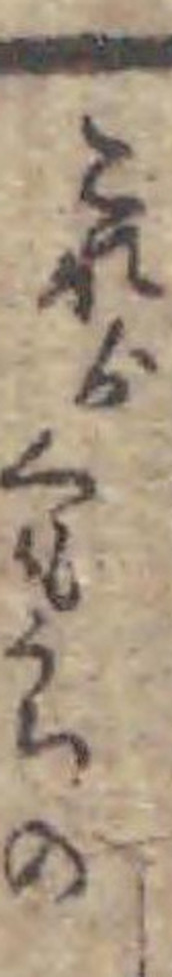これよりくもうちの
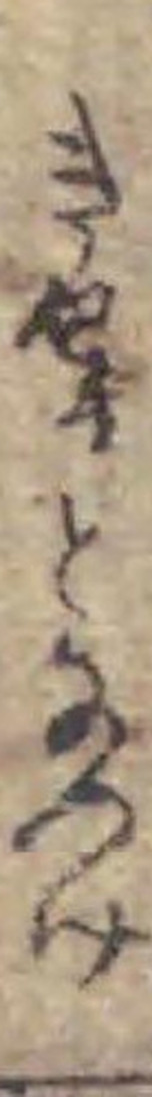きせるとなつけ
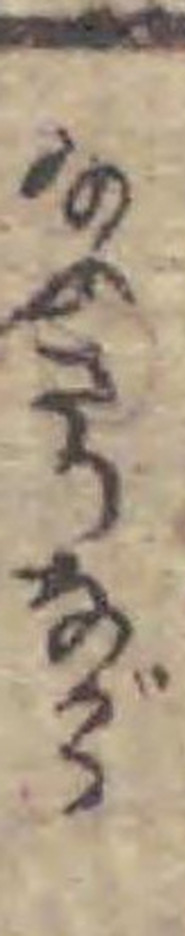給ふさりながら
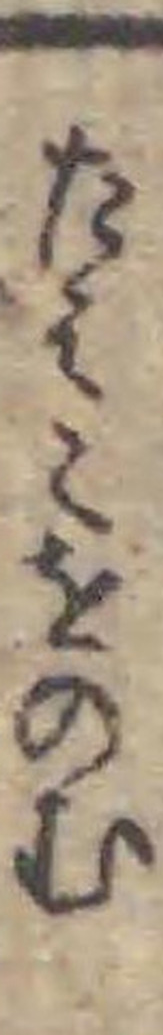たはこをのむ
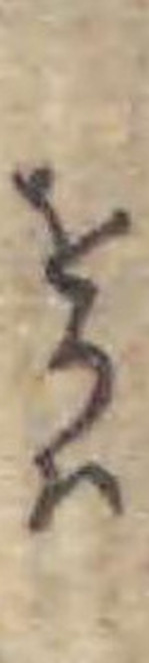をりは
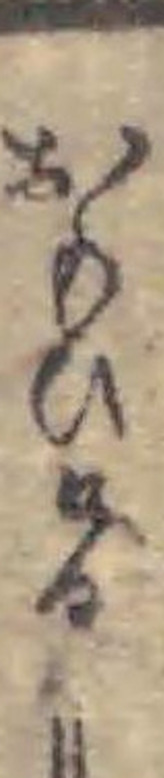おもひける
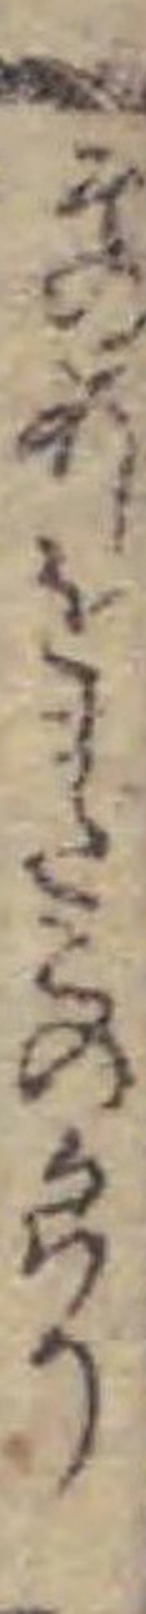そのあしをまたこのかはり
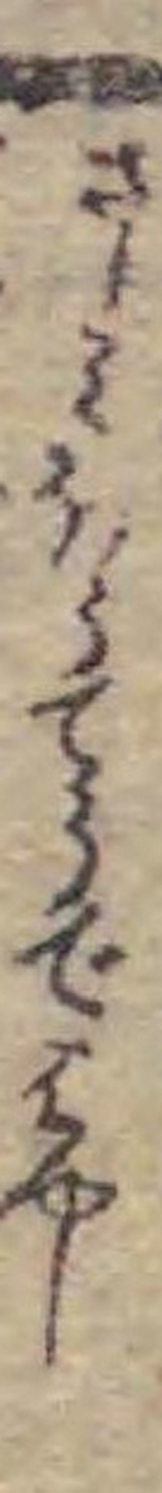さしみほうてうではやし
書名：威気千代牟物語 : 2巻
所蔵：国立国会図書館 National Diet Library, JAPAN
